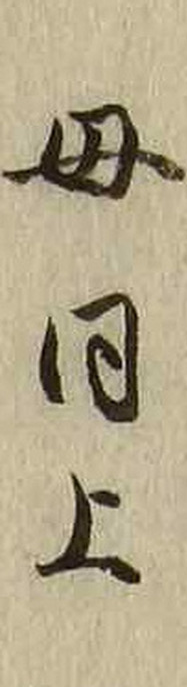母同上
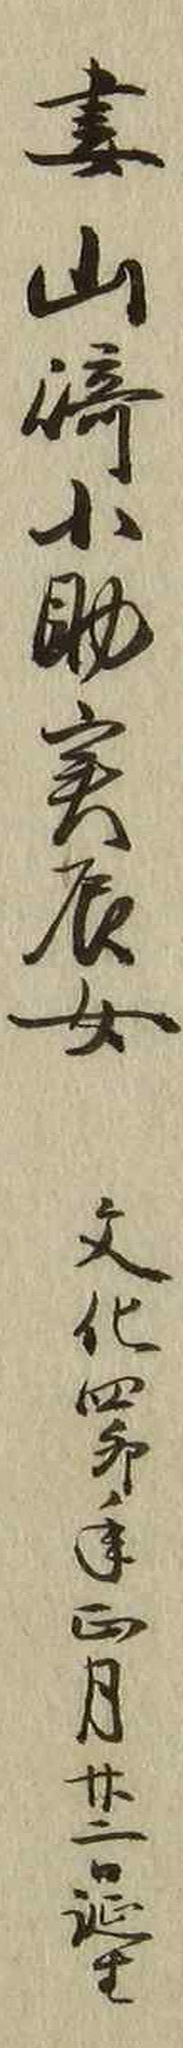妻山崎小助実辰女文化四卯年正月廿二日誕生
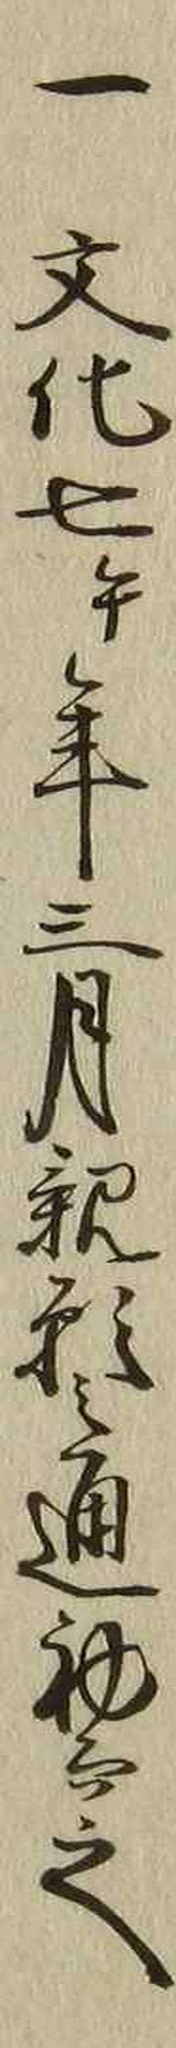一文化七午年三月親願之通初而之
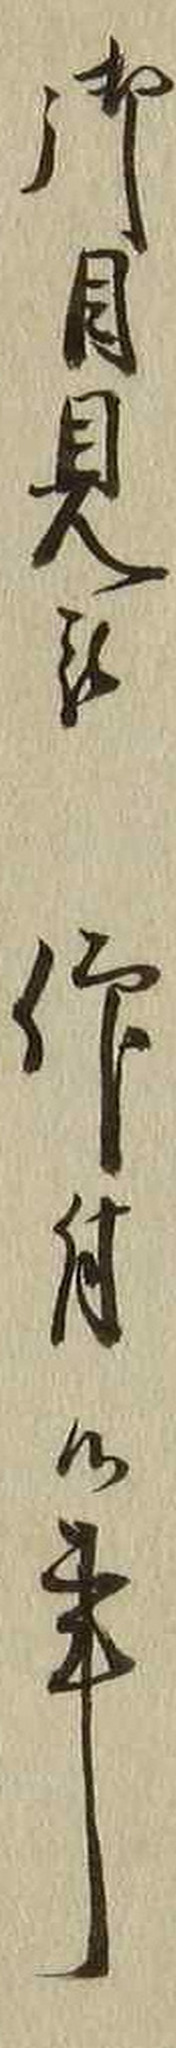御目見被仰付候事
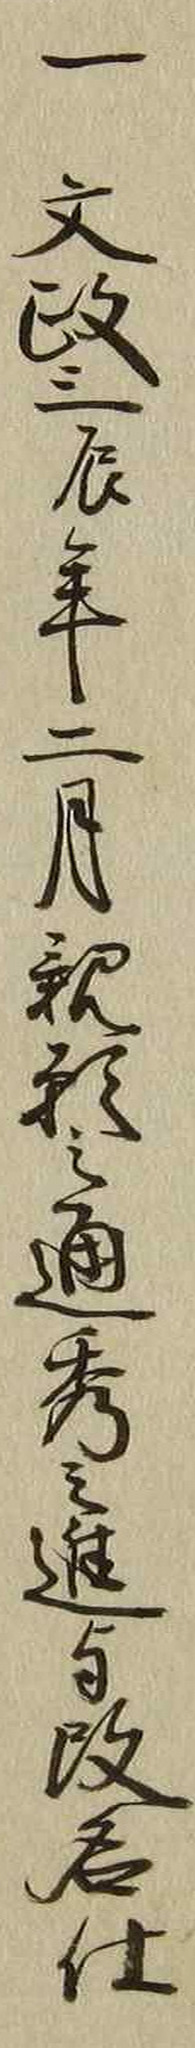一文政三辰年二月親願之通秀之進与改名仕
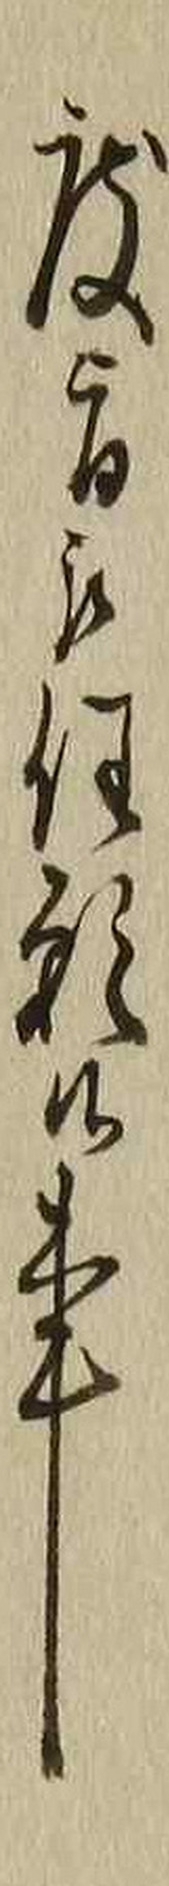度旨被伺願候事
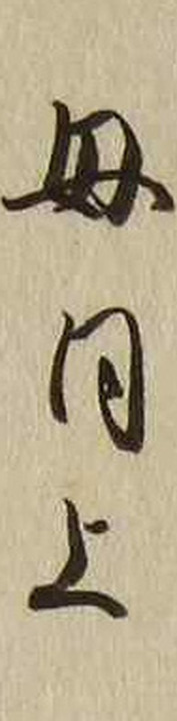母同上
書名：諸士系譜　巻之65　ち之部1
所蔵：会津若松市立会津図書館
